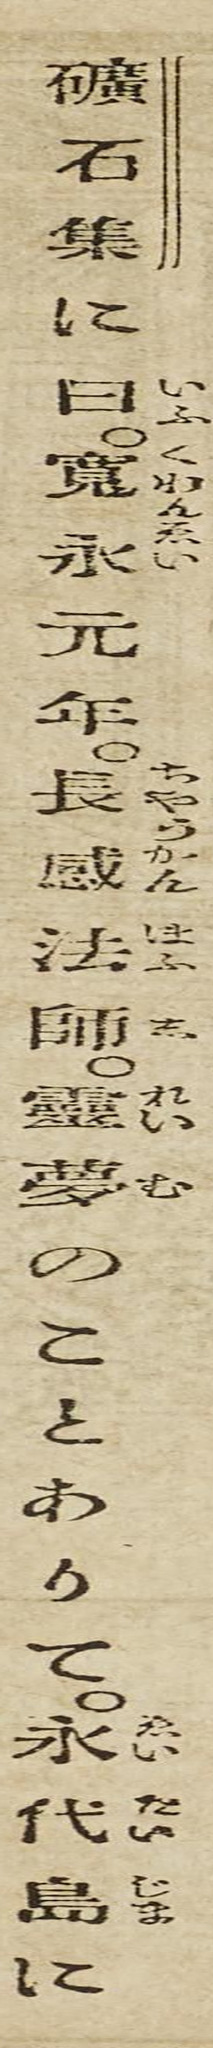砿石集に曰。寛永元年。長感法師。霊夢のことありて。永代島に
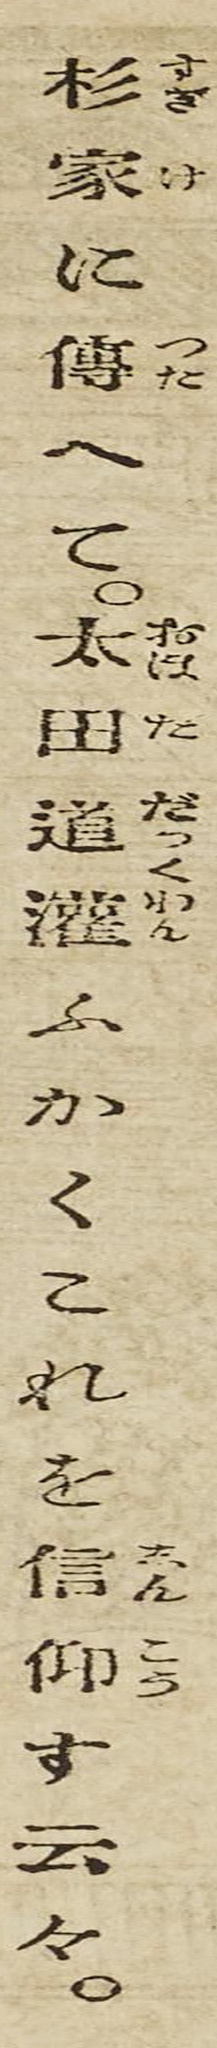杉家に伝へて。太田道灌ふかくこれを信仰す云々。
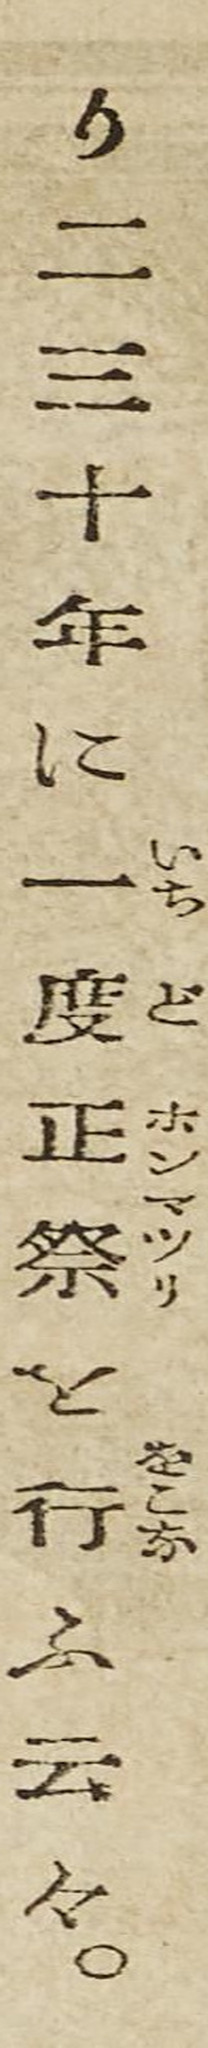り二三十年に一度本祭を行ふ云々。
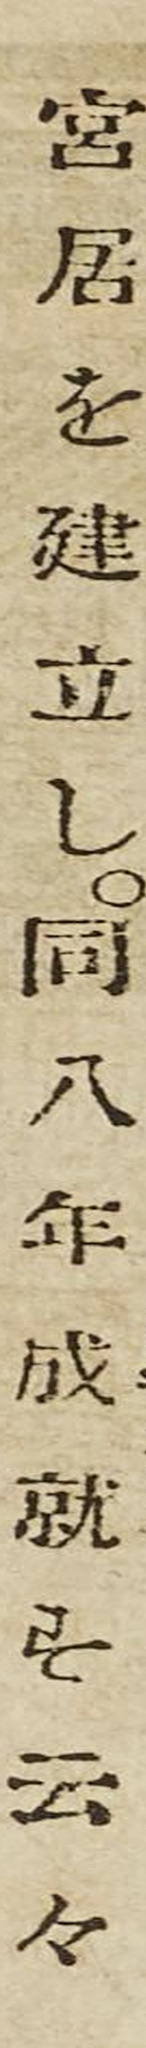宮居を建立し。同八年成就す云々
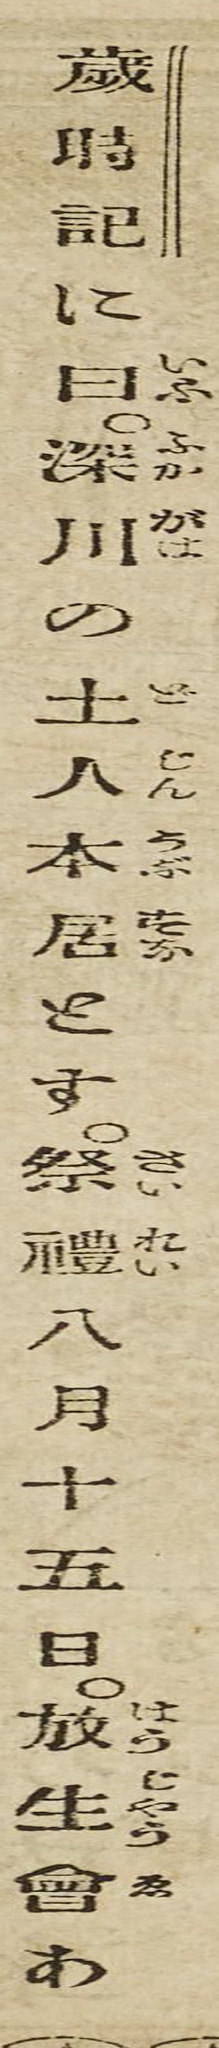歳時記に曰。深川の土人本居とす。祭礼八月十五日。放生会あ
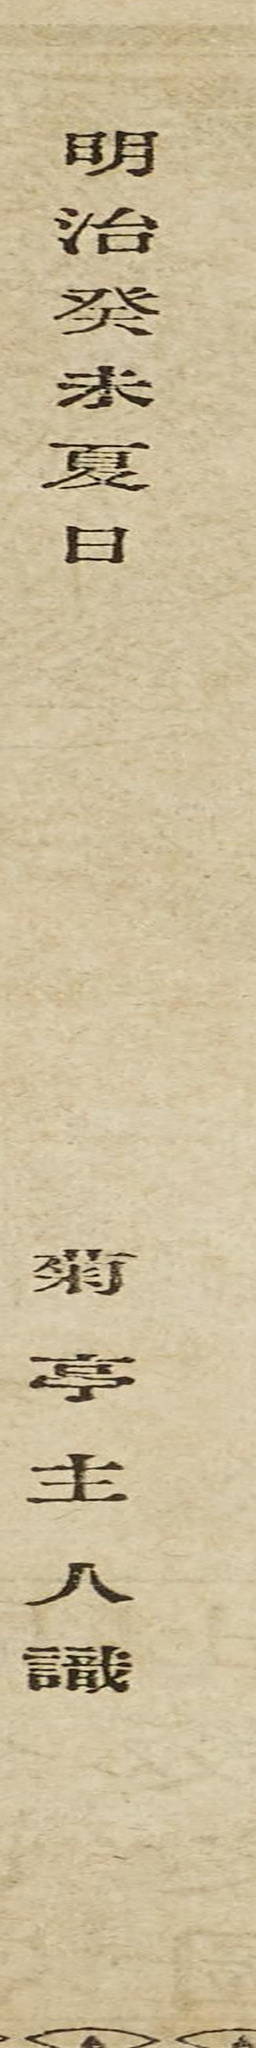明治癸未夏日菊亭主人識

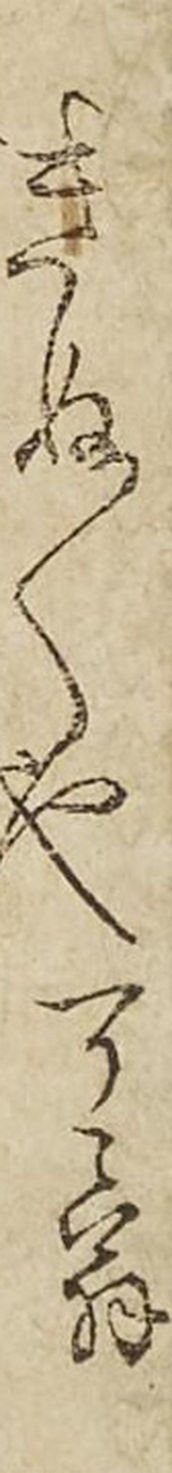きぬ〳〵や了々翁
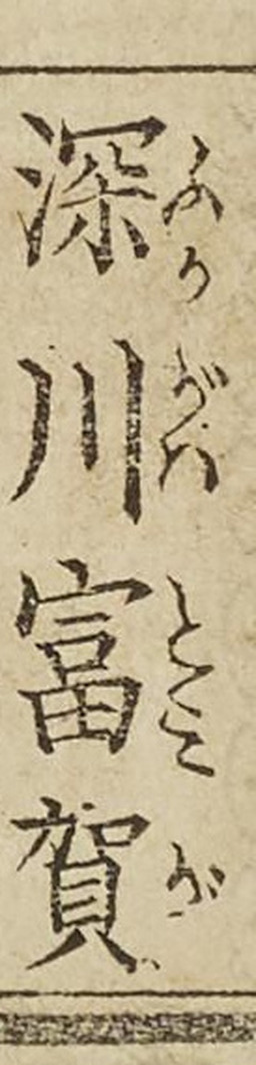深川富賀
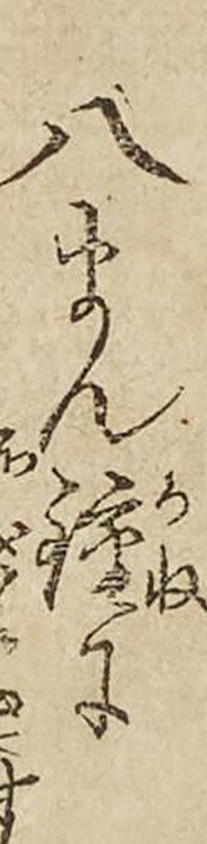八まん鐘に
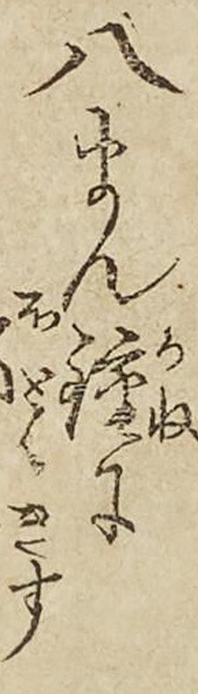八まん鐘に
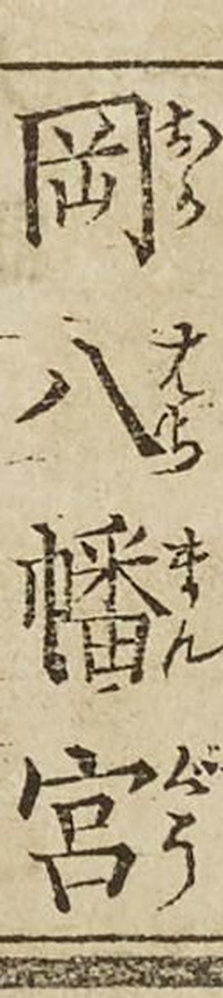岡八幡宮
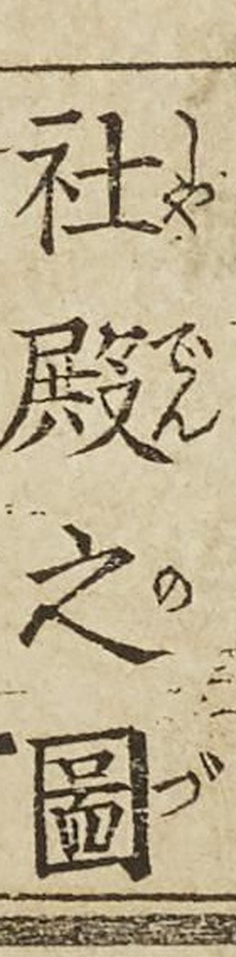社殿之図
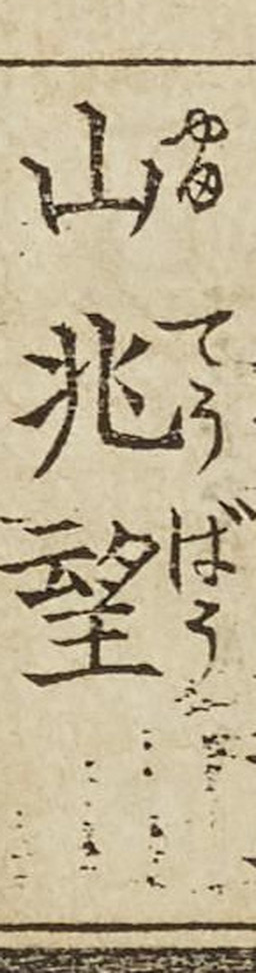山兆望
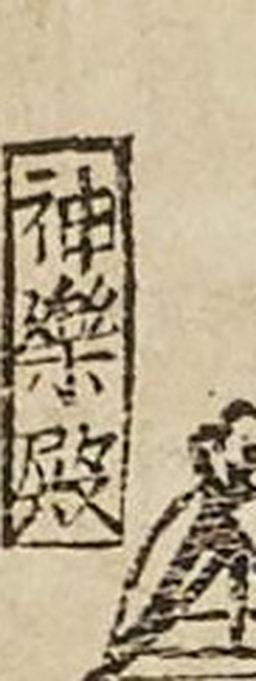神楽殿
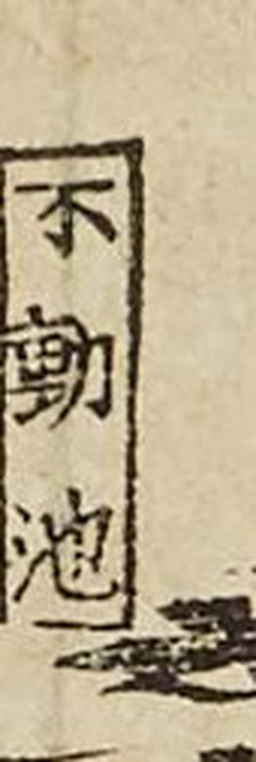不動池

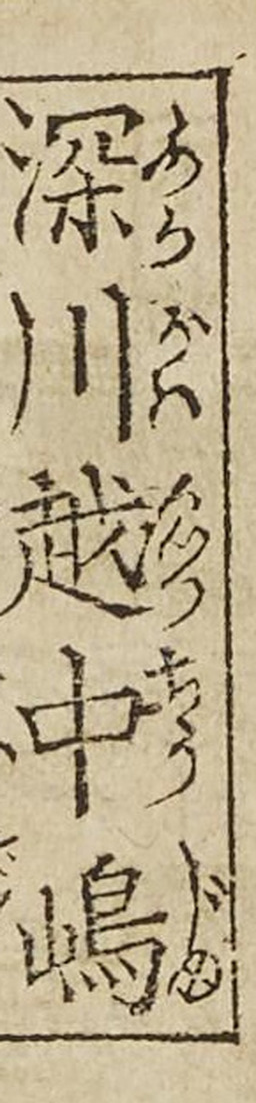深川越中嶋
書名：永代惨話　文化の夢　全
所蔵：東京大学地震研究所図書室 Earthquake Research Institute Library, The University of Tokyo, JAPAN
